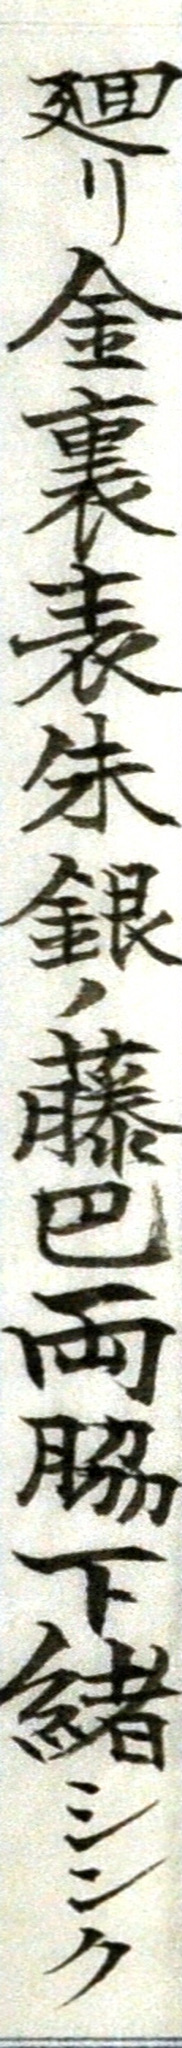廻り金裏表朱銀ノ藤巴両脇下緒シンク
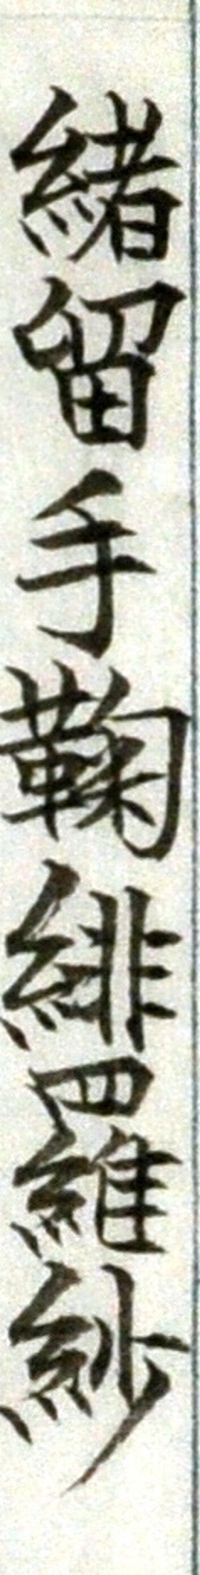緒留手鞠緋羅紗
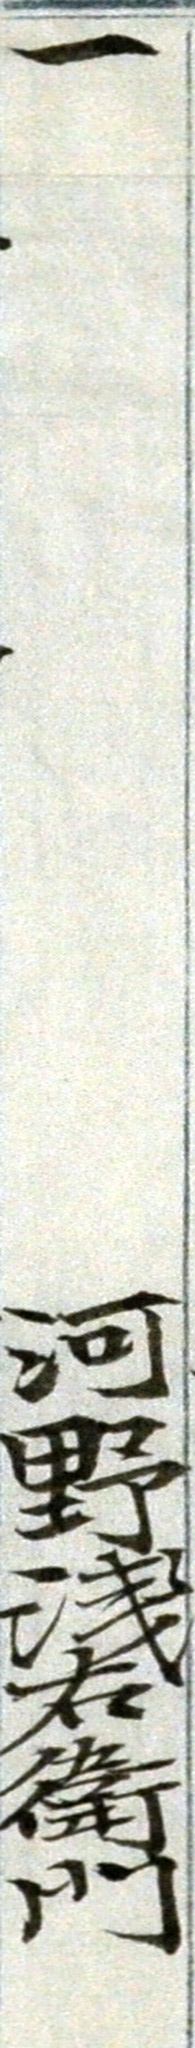一河野浅右衛門
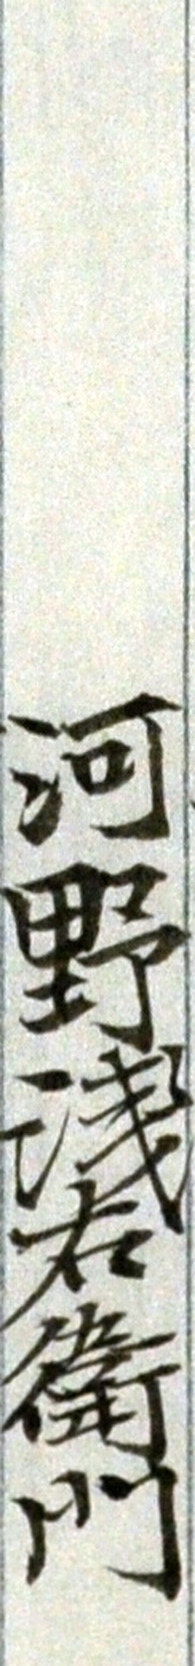一河野浅右衛門
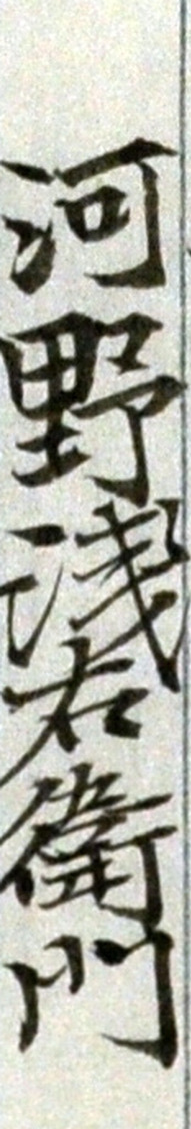一河野浅右衛門
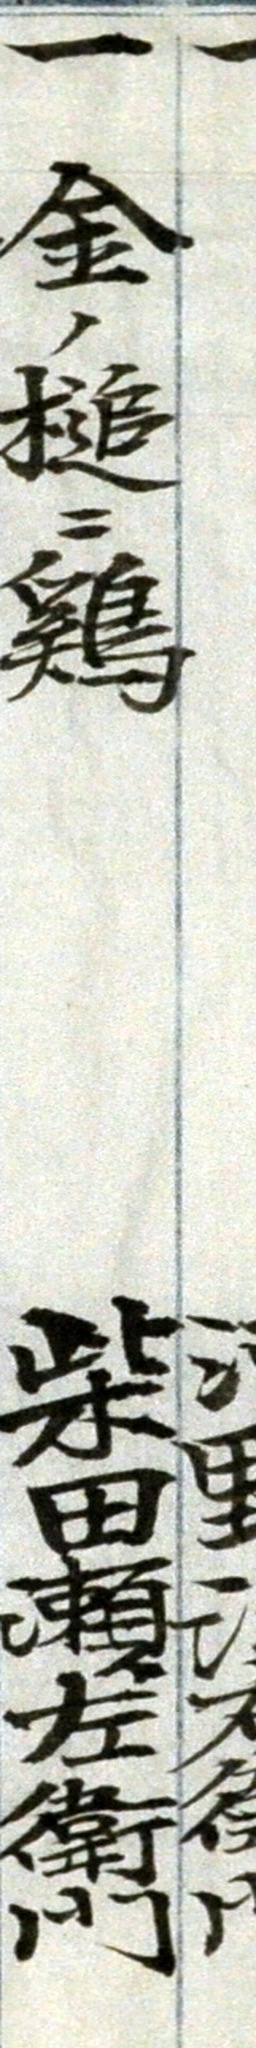一金ノ槌二鶏柴田瀬左衛門
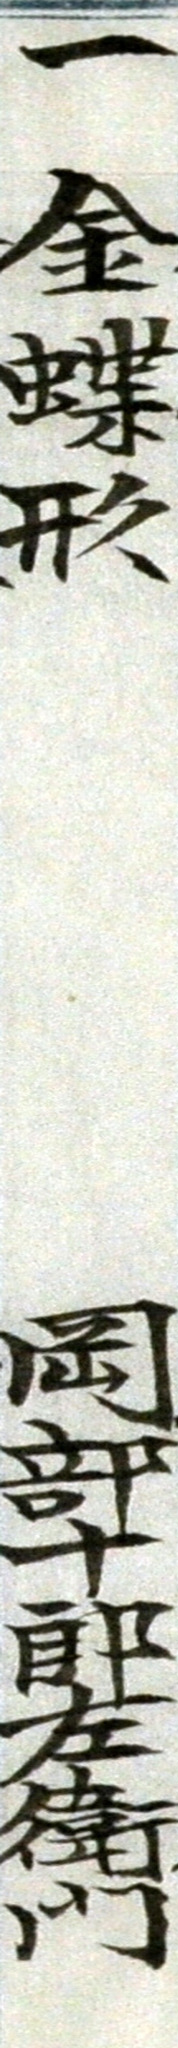一金蝶形岡部十郎左衛門
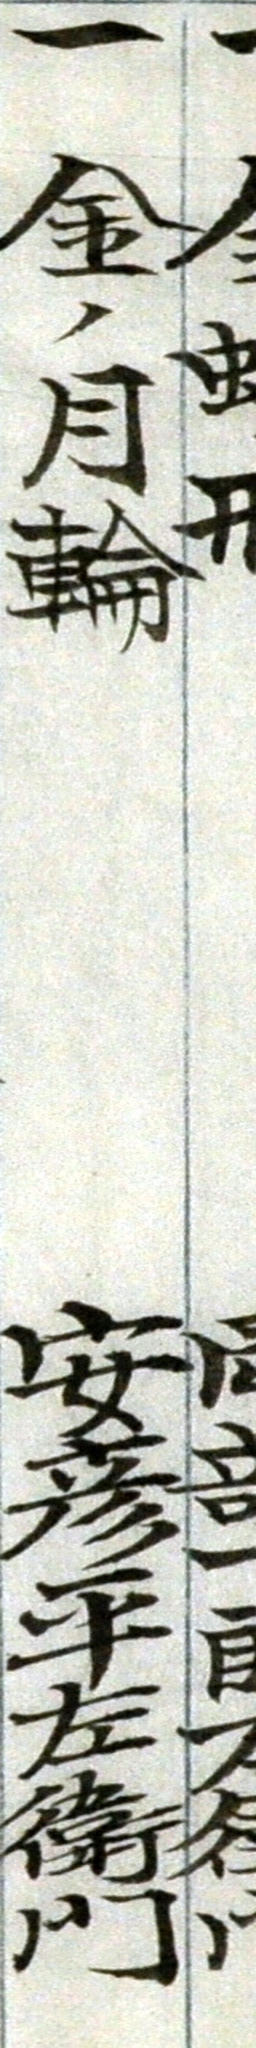一金ノ月輪安彦平左衛門
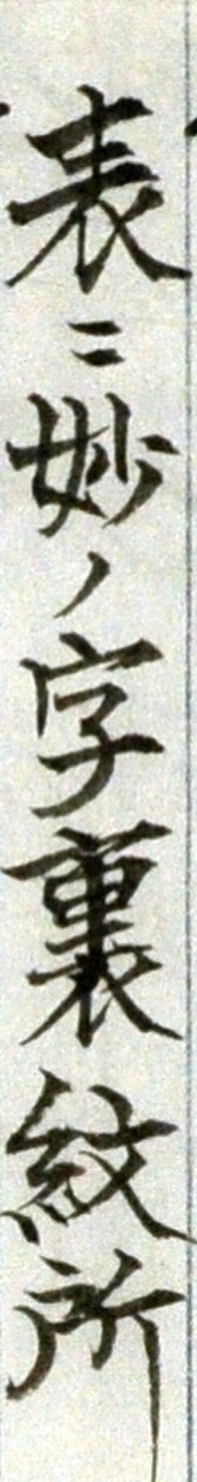表二妙ノ字裏紋所
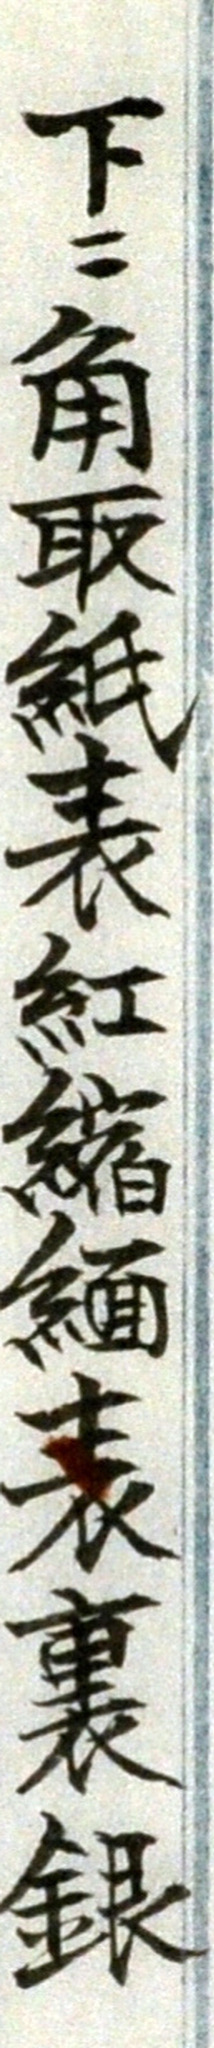下ニ角取紙表紅縮緬表裏銀
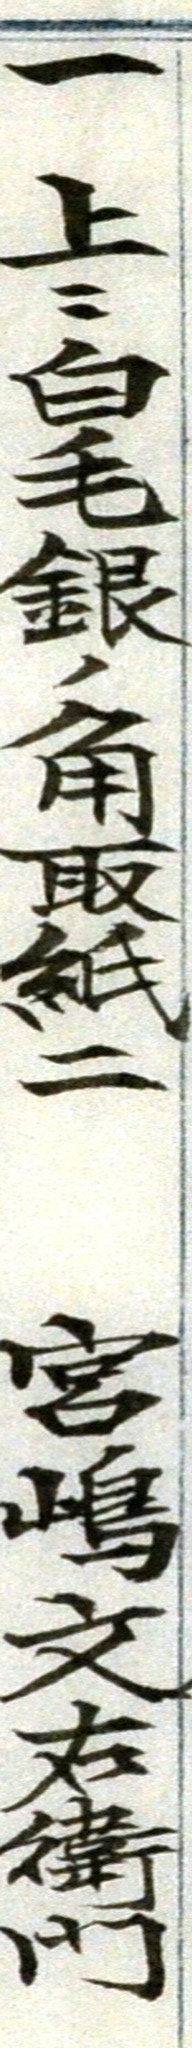一上ニ白毛銀ノ角取紙二宮嶋文右衛門
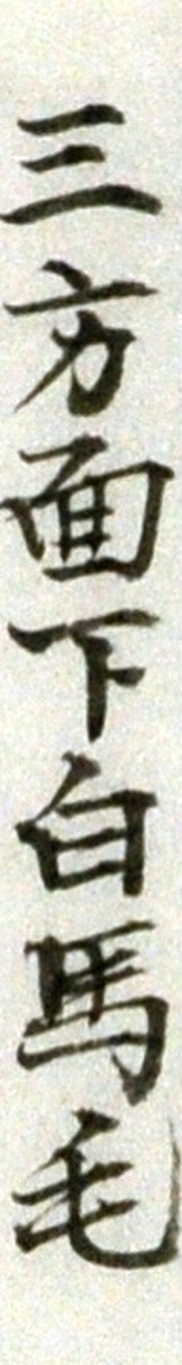四方面下ニ白馬毛
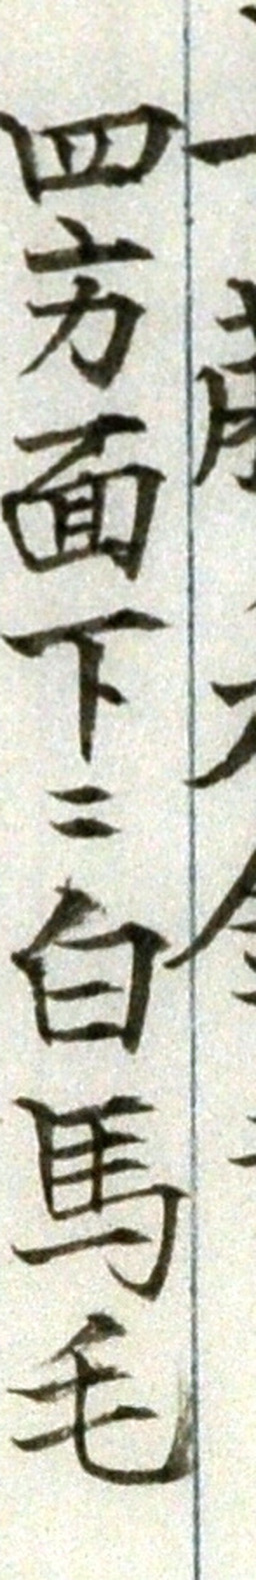四方面下ニ白馬毛
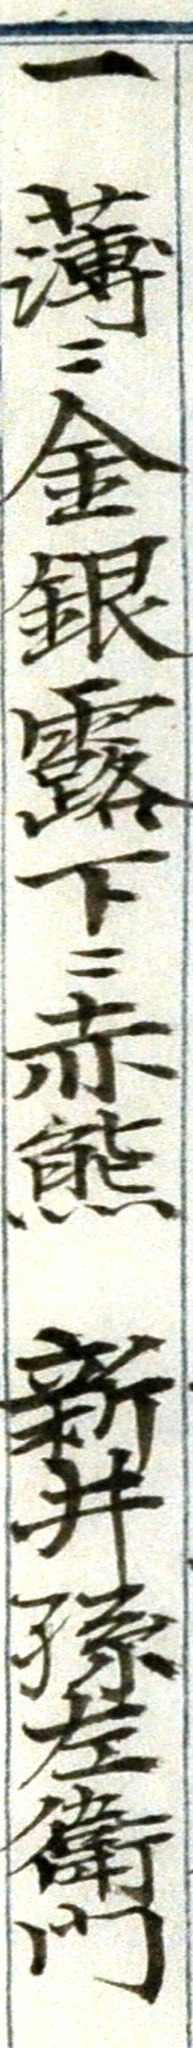一薄二金銀露下ニ赤熊新井孫左衛門

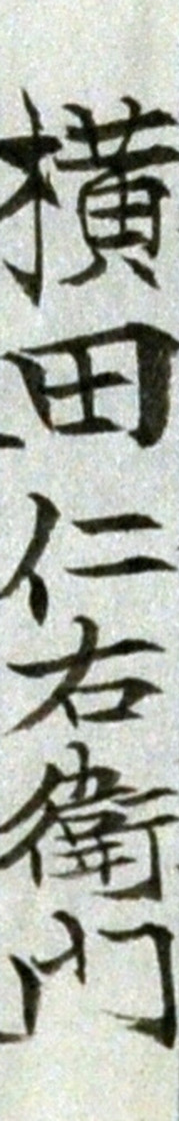一横田仁右衛門
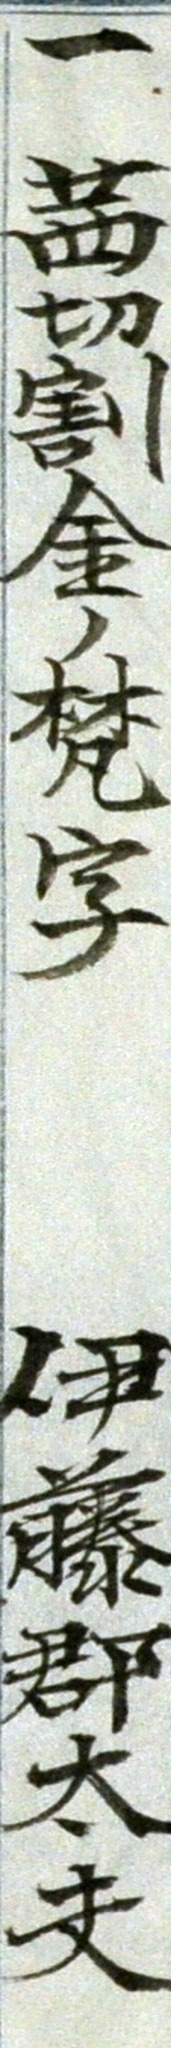一廿四切割金ノ梵字伊藤郡太夫
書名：江戸高遠出シ品附之写
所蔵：伊那市立高遠町図書館・合同会社AMANE
